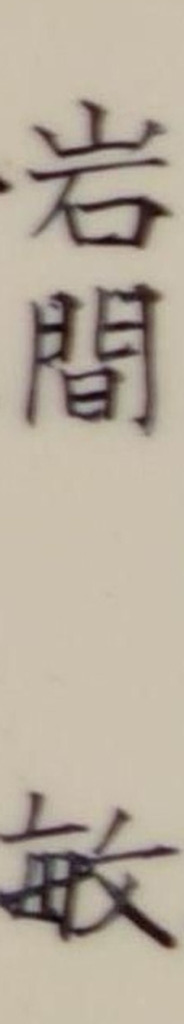岩間敏
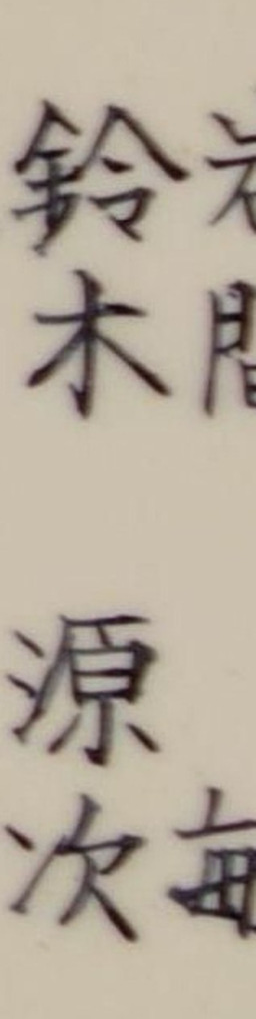鈴木源次
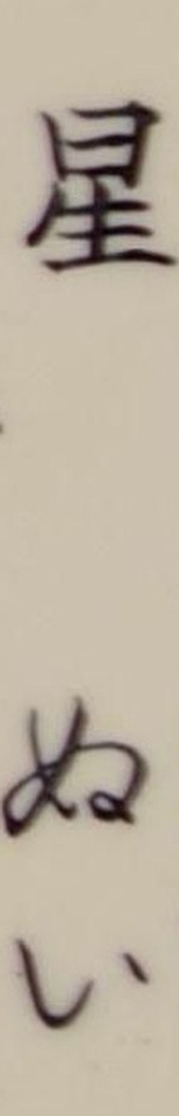星ぬい
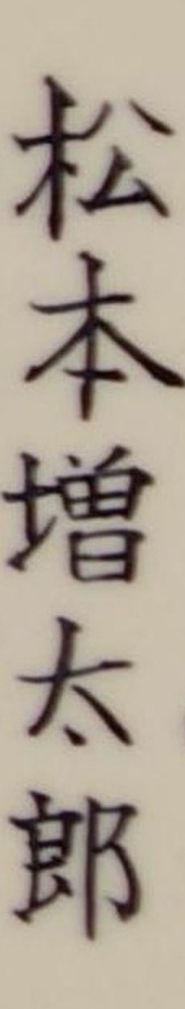松本増太郎
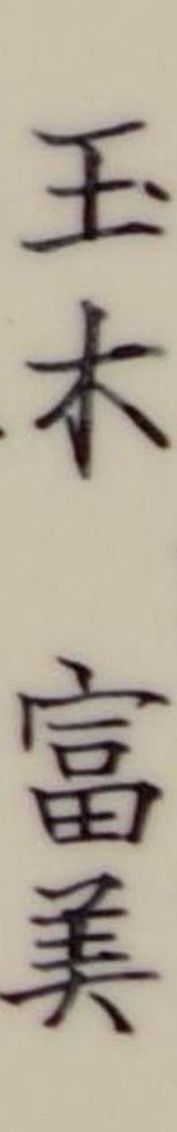玉木富美
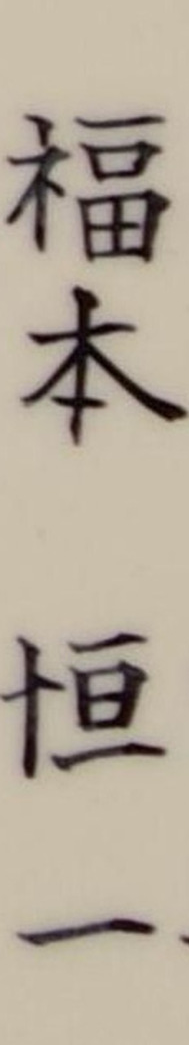福本恒一
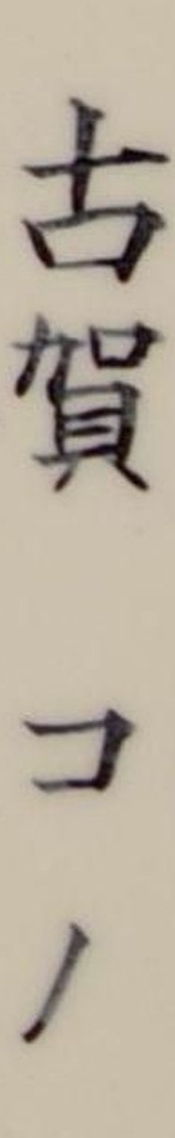古賀コノ
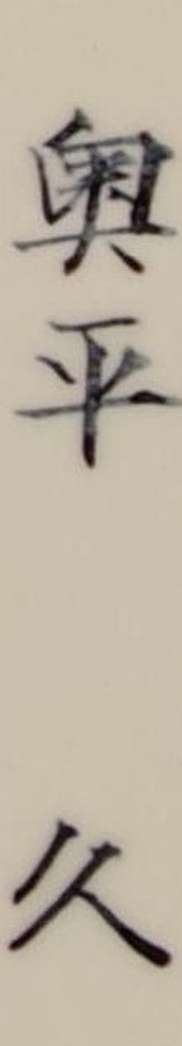奥平久
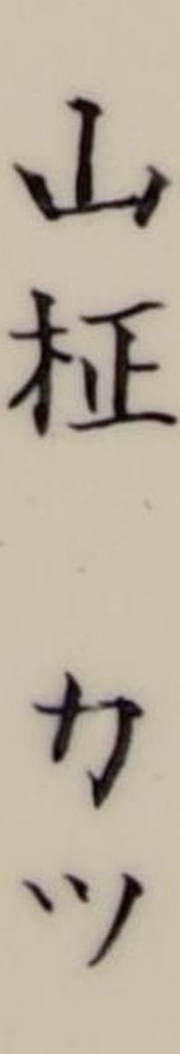山柾カツ
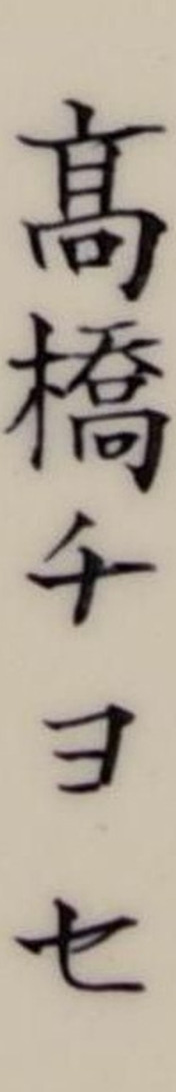高橋チヨセ
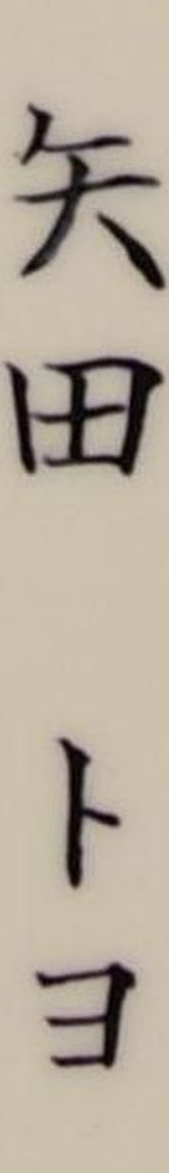矢田トヨ
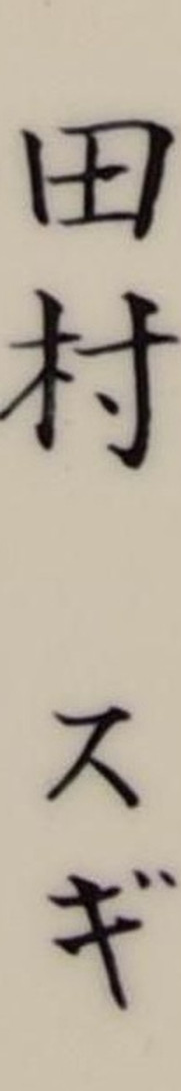田村スギ
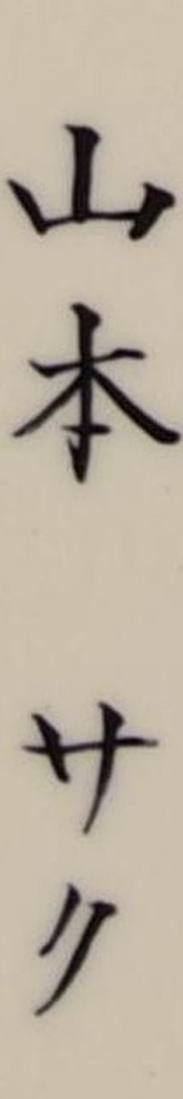山本サク
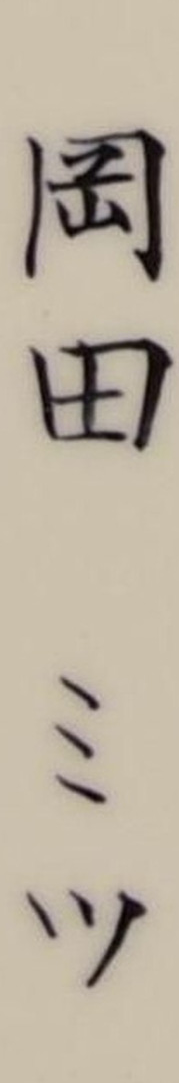岡田ミツ
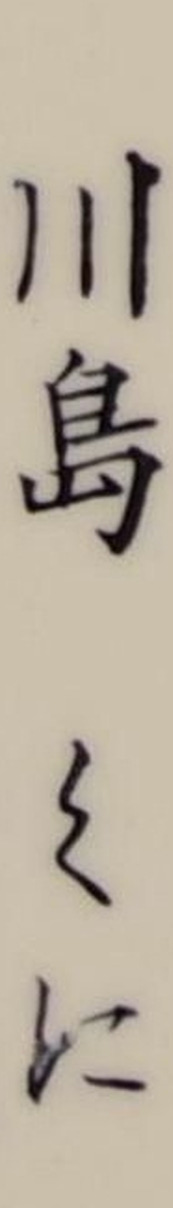川島くに
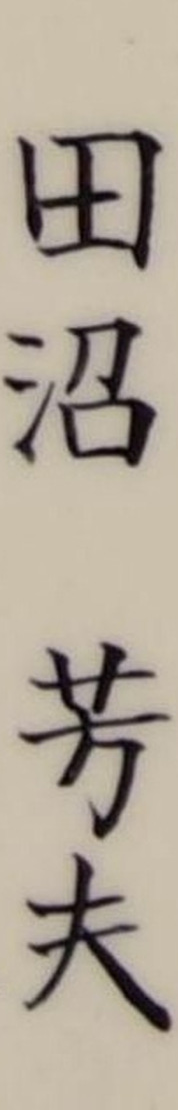田沼芳夫
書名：M~S
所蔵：高野山金剛峯寺
